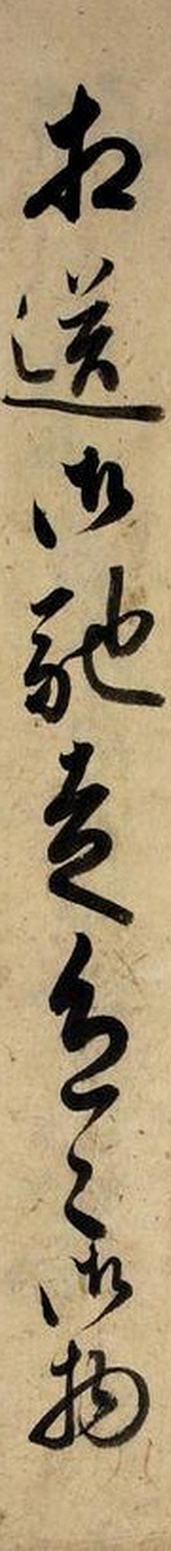相送御馳走色〻御物
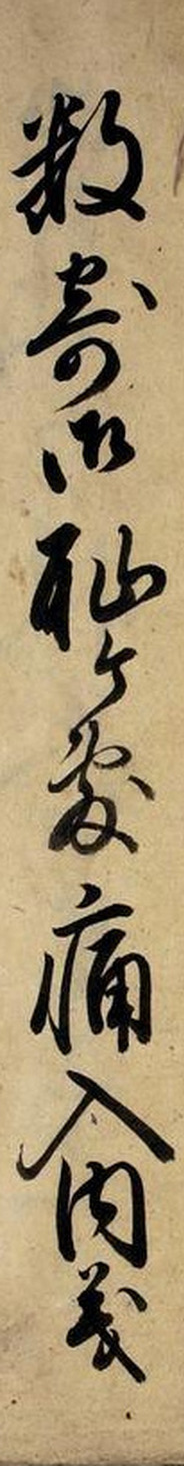数寄御恥ヶ敷痛入内義
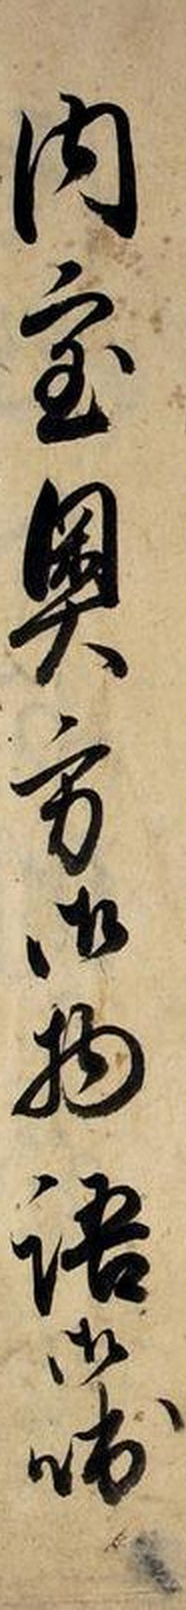内室奥方御物語御咄
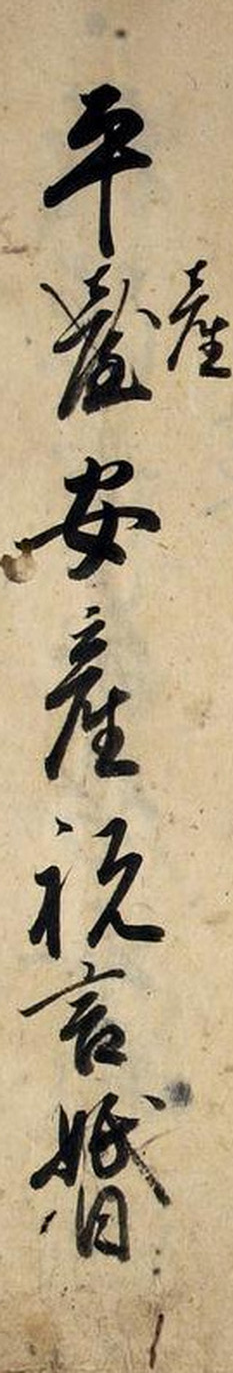平産安産祝言婚

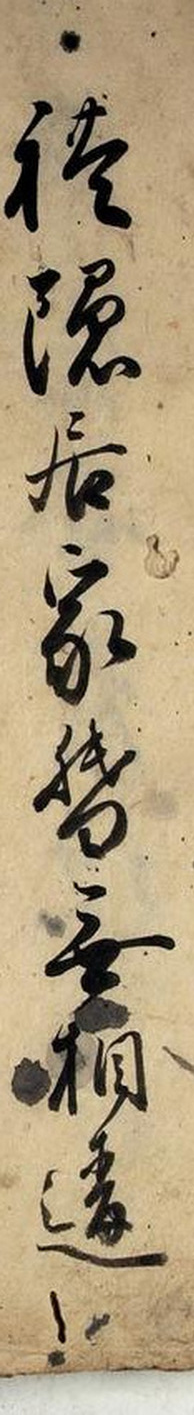礼隠居家督無相違
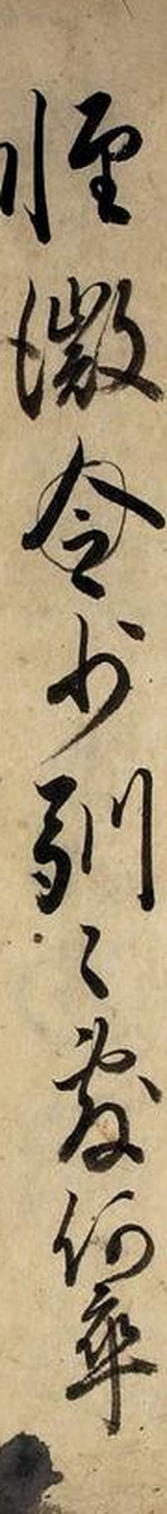軽微乏少馴々敷何卒
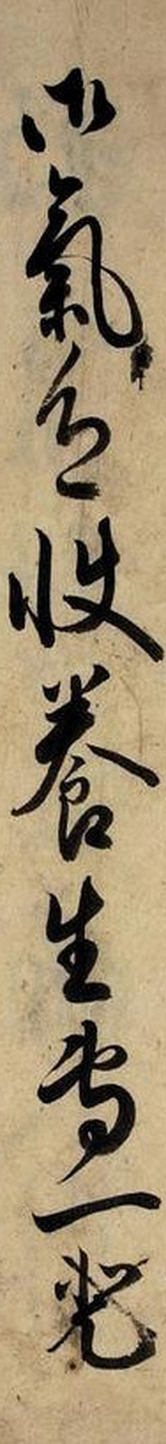御気色快養生専一登
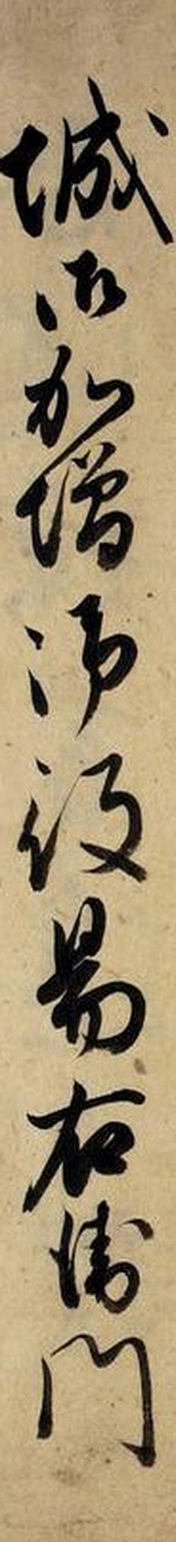城御加増御役易右衛門
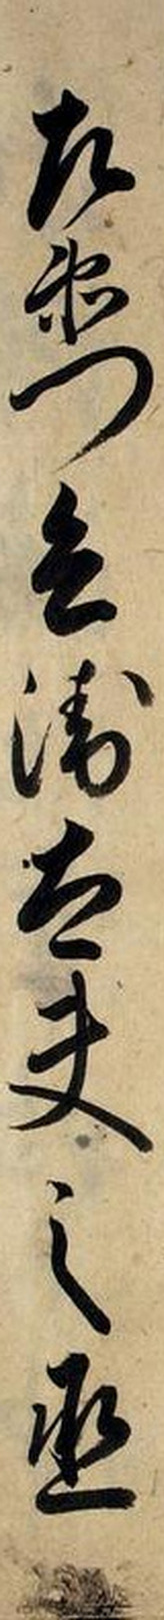左衛門兵衛太夫之丞
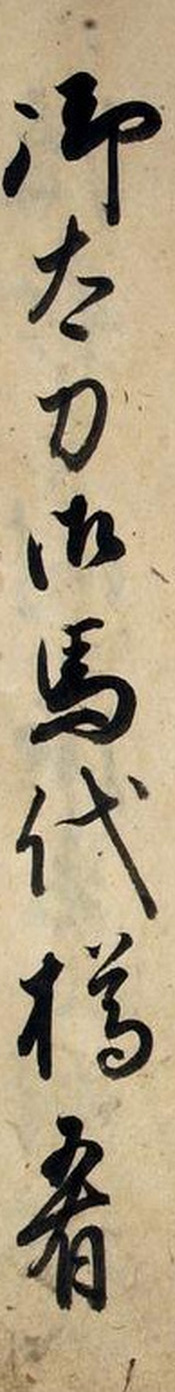御太刀御馬代樽肴

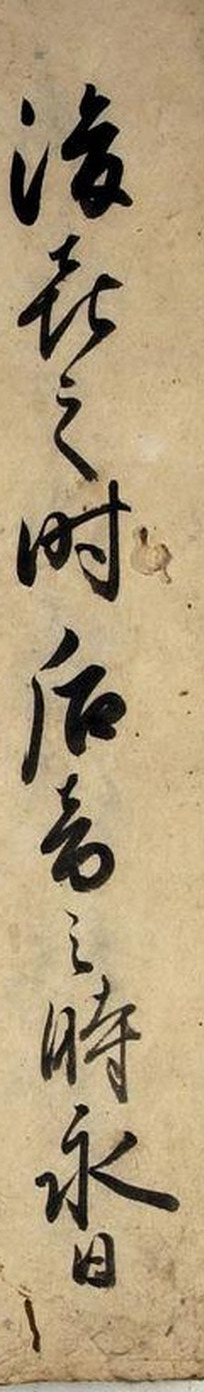後喜之時后音之時永日
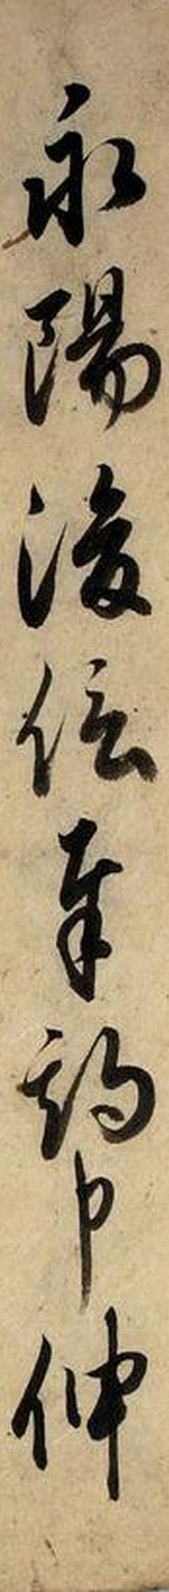永陽後信奉期申伸
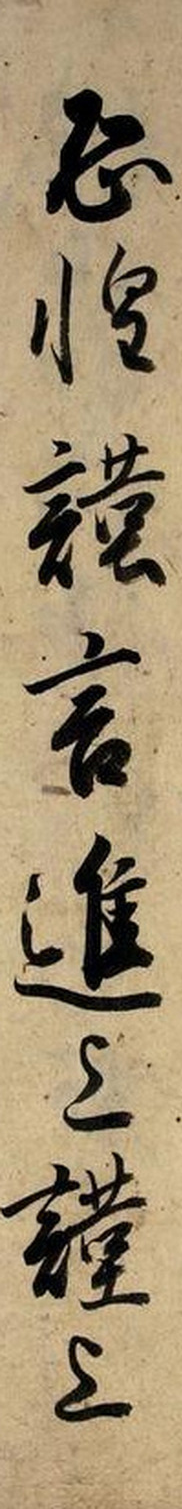恐惶謹言進上謹上
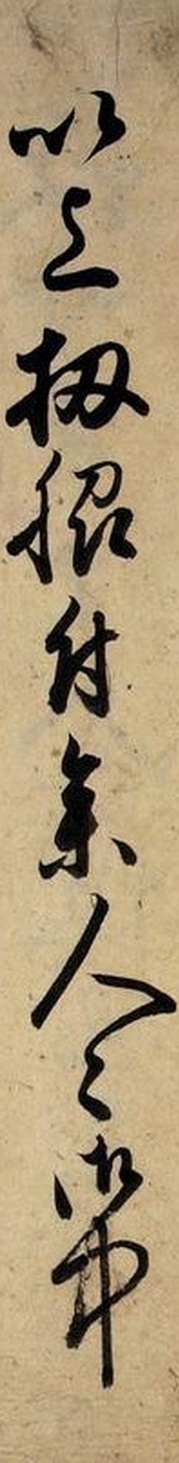以上扨脇付参人々御中
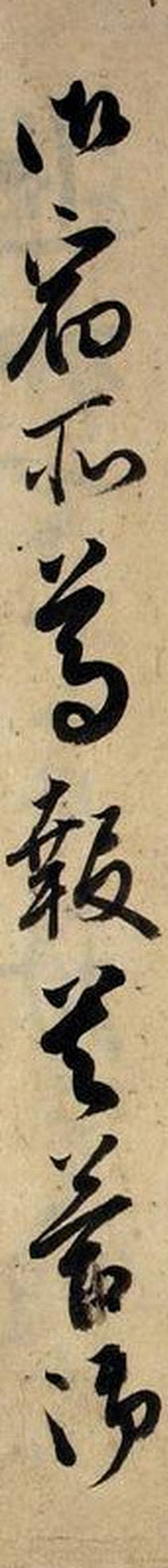御宿所尊報貴答御
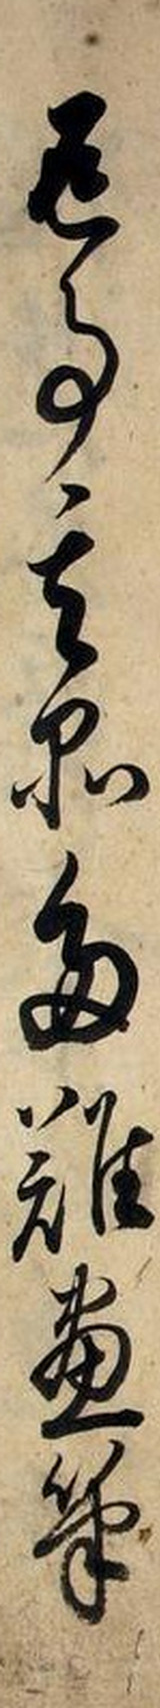返事其品多難尽筆
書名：消息千字文（往来物、手習手本）
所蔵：福井県文書館 Fukui Prefectural Archives
